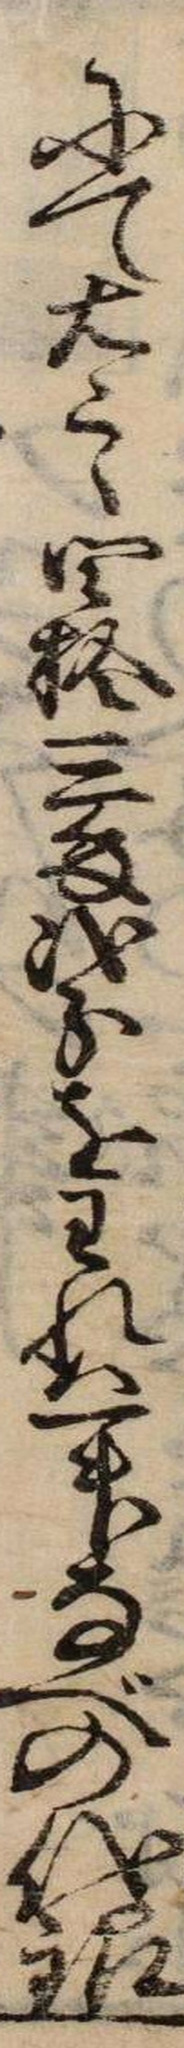にて右之四拾三匁弐分をわれは一升なべの代銀
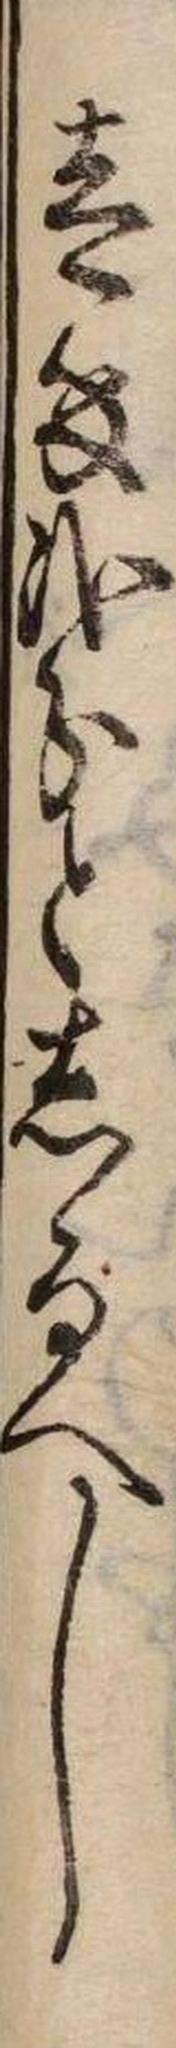壱匁弐分としるへし
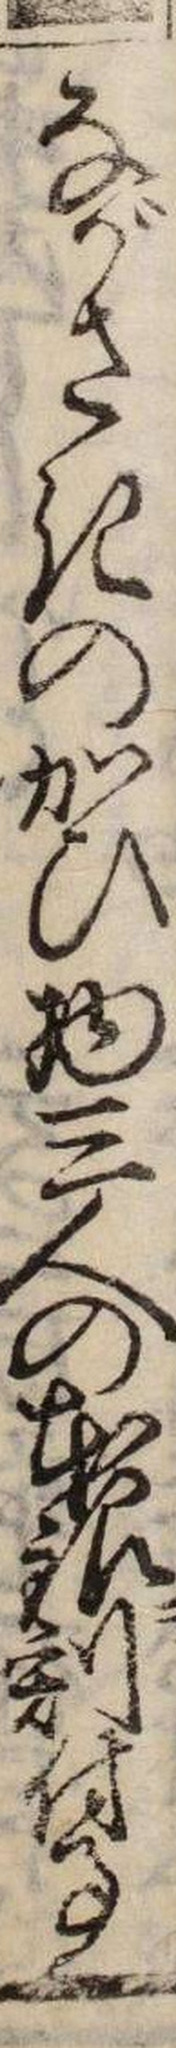第二ながさきのかひ物三人の本銀に割付事
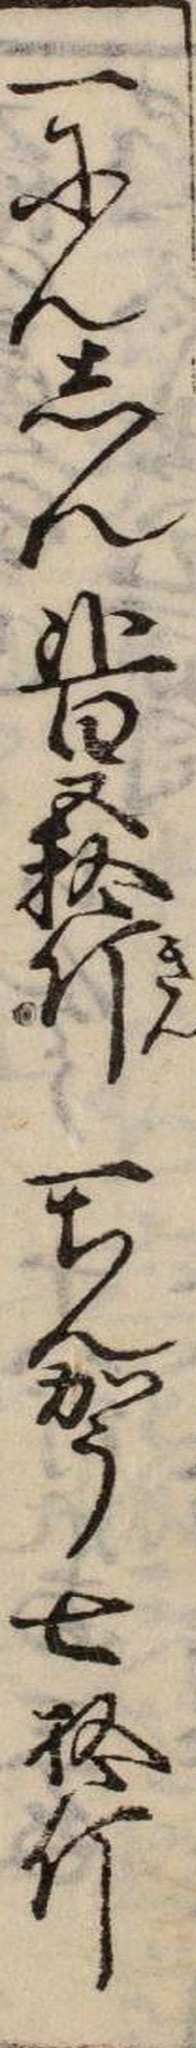一にんしん弐百五拾斤一ちんかう七拾斤
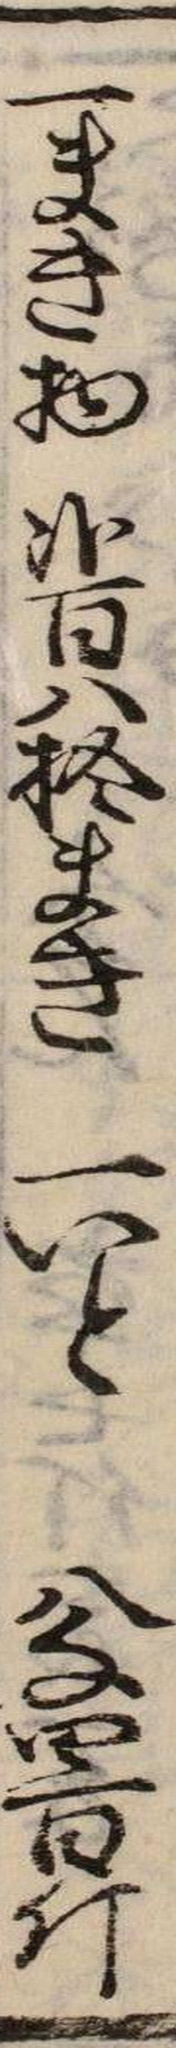一まき物弐百八拾まき一いと八千四百斤
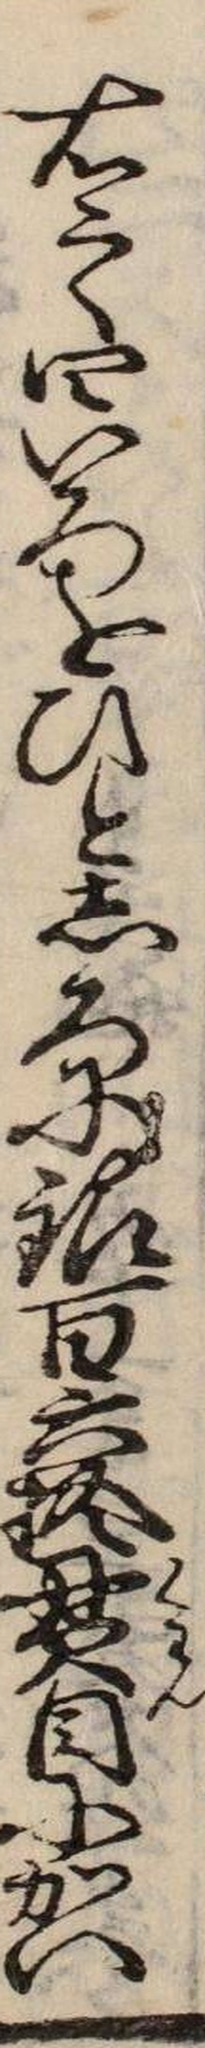右之四いろをひとしるに銀百六拾貫目にかい
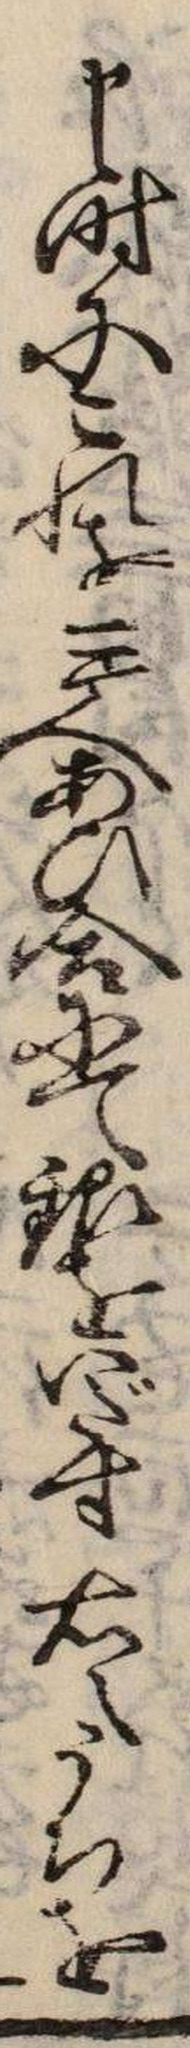申候時にこれを三人あひ合にて銀をいだす右うちを
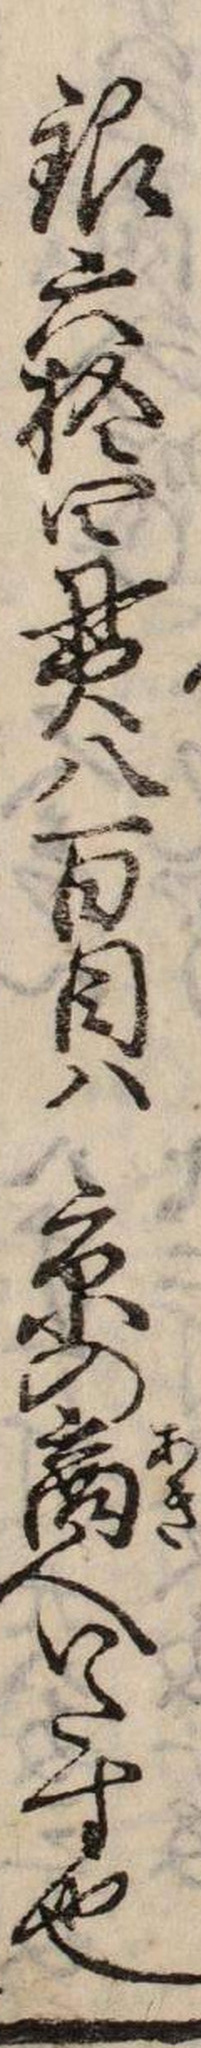銀六拾四貫八百目は京の商人いたす也
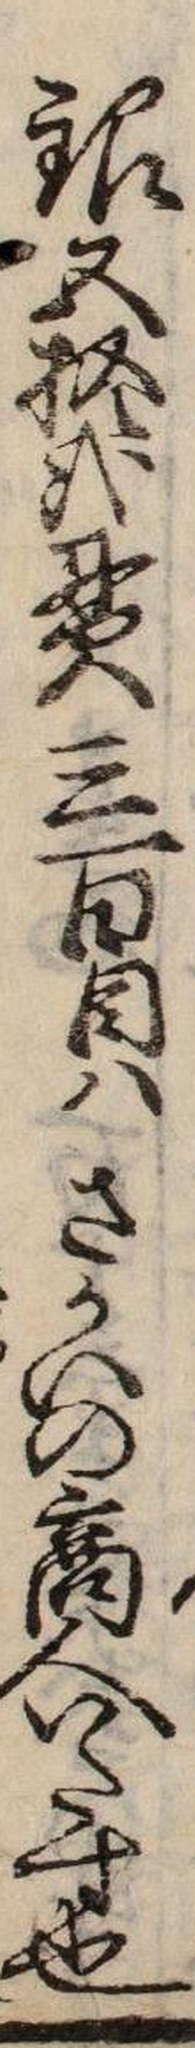銀五拾弐貫三百目はさかいの商人いたす也
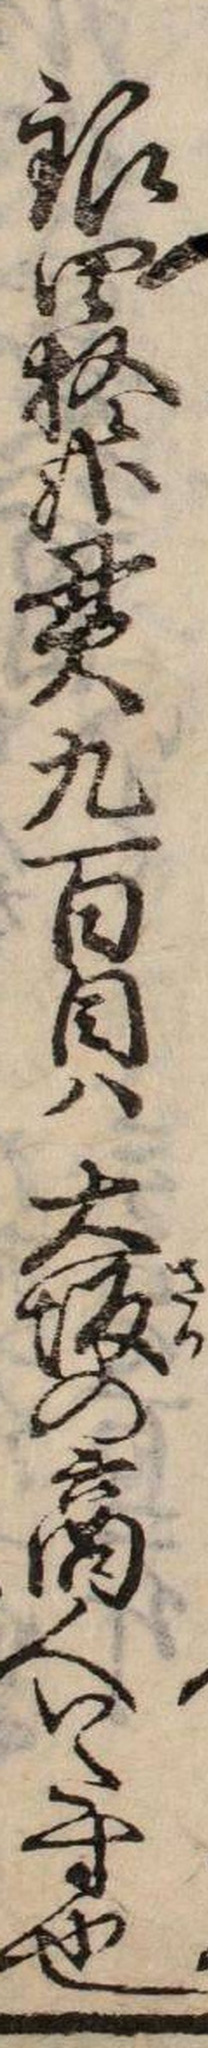銀四拾弐貫九百目は大坂の商人いたす也
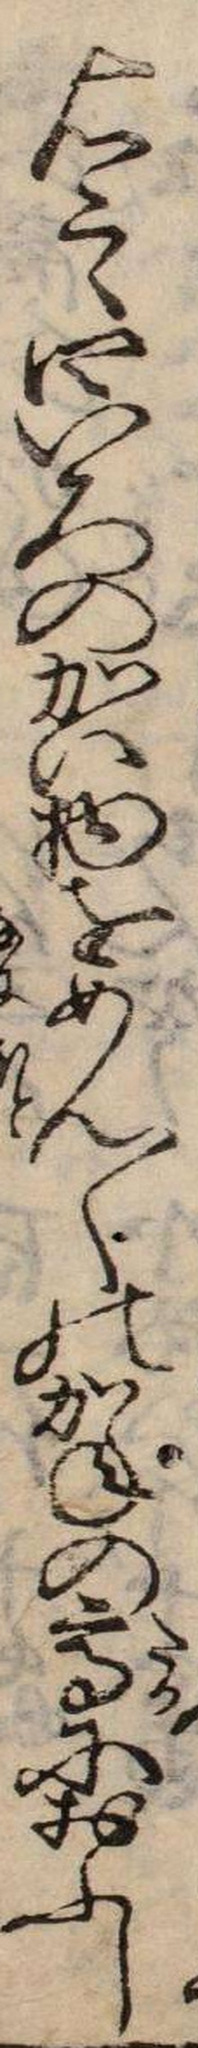右之四いろのかい物をめん〳〵のかねの高におふし
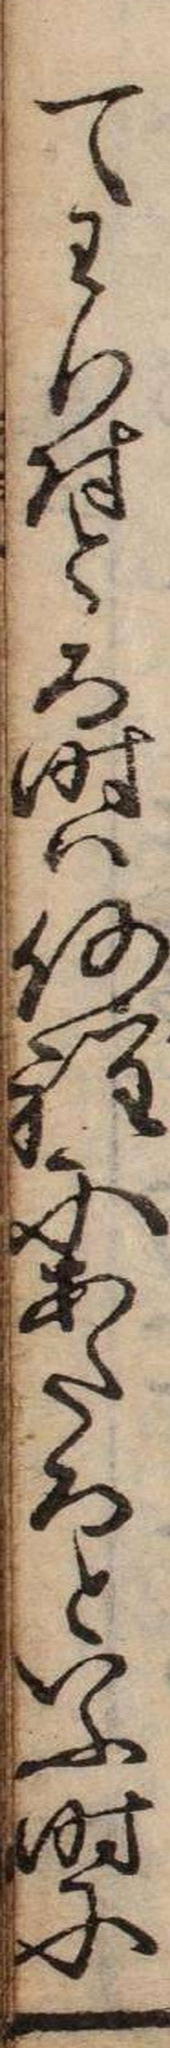てわり付とる時は何程にあたるといふ時に

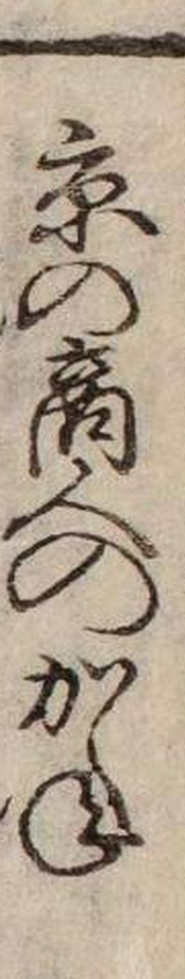京の商人のかね
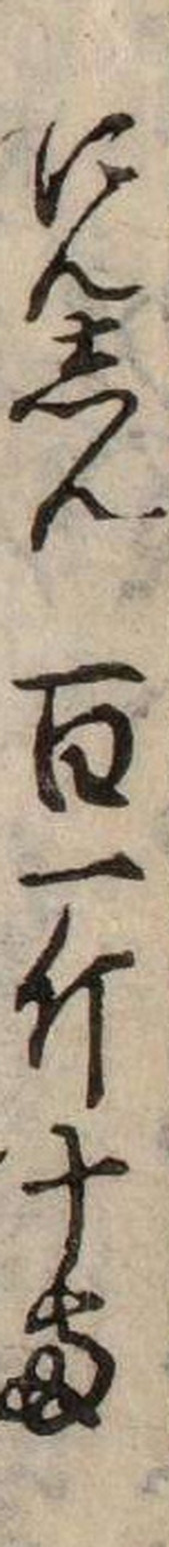にんしん百一斤十両
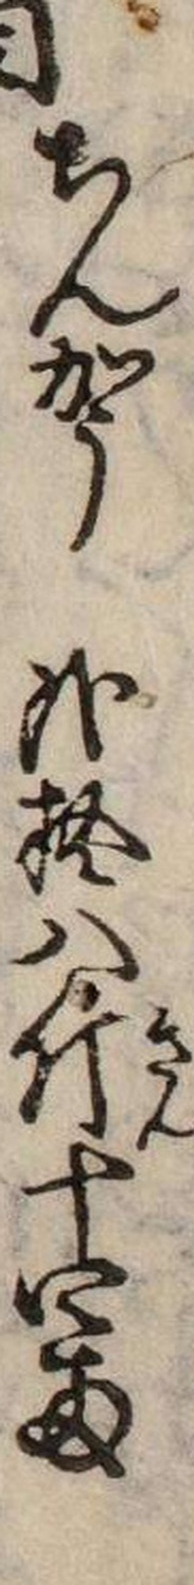ちんかう弐拾八斤十四両
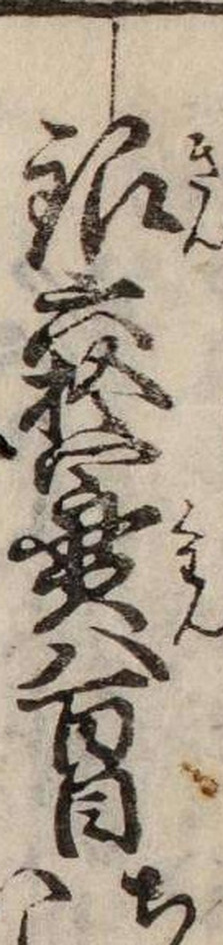銀六拾四貫八百目
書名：塵劫記（寛永11年自跋、京都府立京都学・歴彩館追貴8）
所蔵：京都府立京都学・歴彩館 国文学研究資料館
